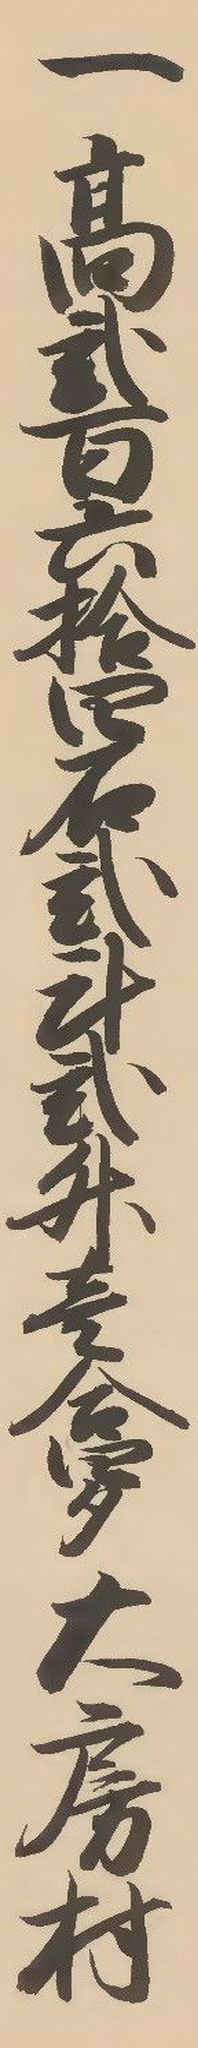一高弐百六拾四石弐斗弐升壱合四勺大房村
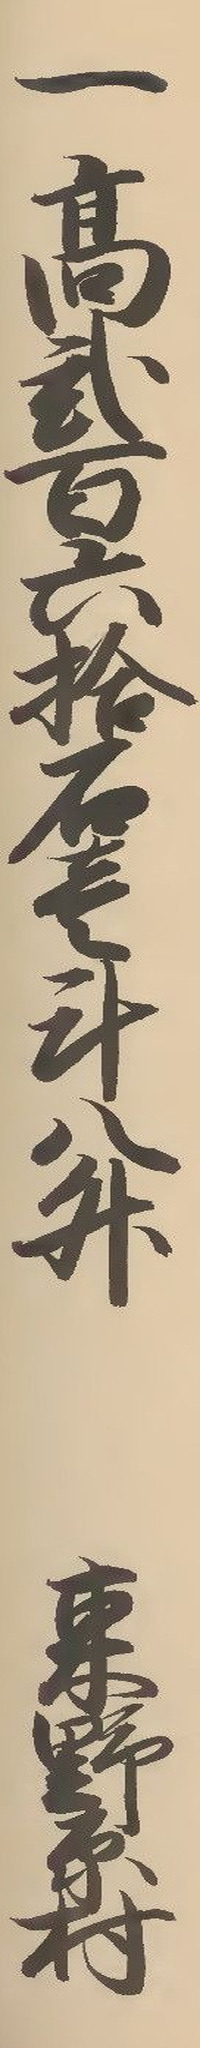一高弐百六拾石壱斗八升東野原村
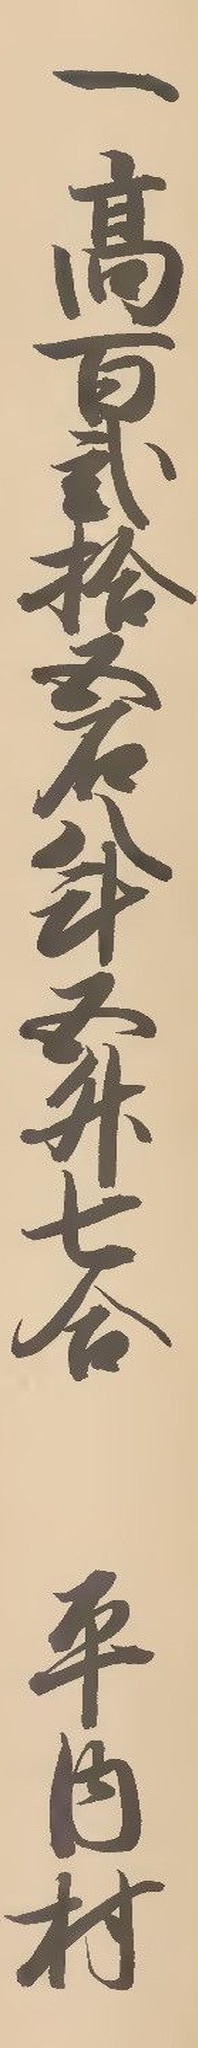一高百弐拾五石八斗五升七合平内村
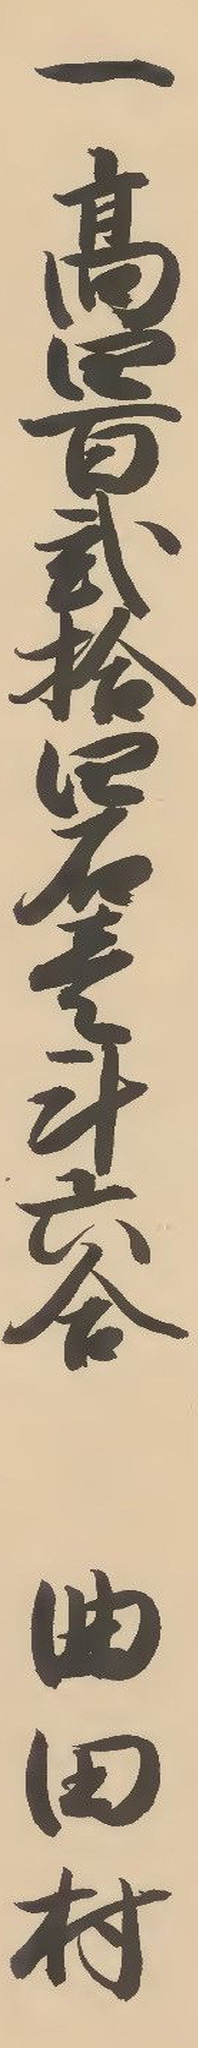一高四百弐拾四石壱斗六合曲田村
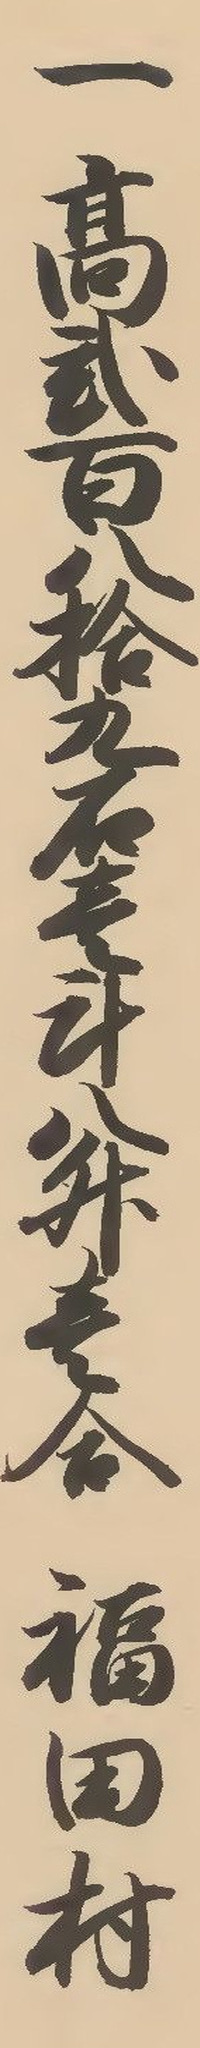一高弐百八拾九石壱斗八升壱合福田村
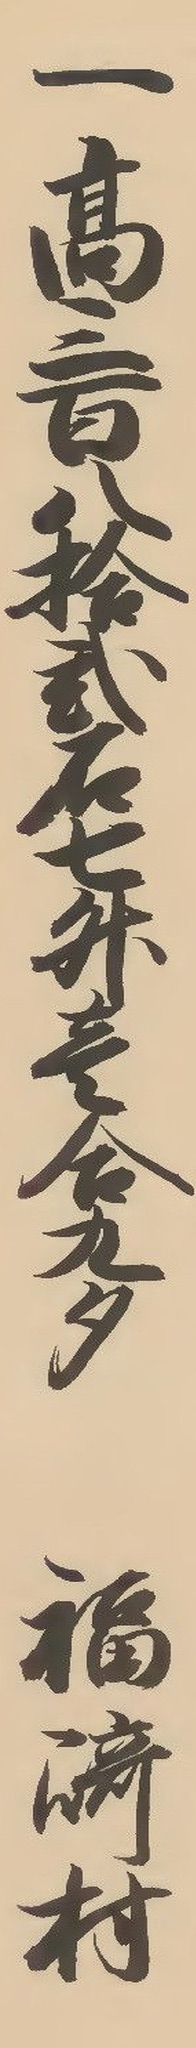一高三百八拾弐石七升壱合九勺福崎村

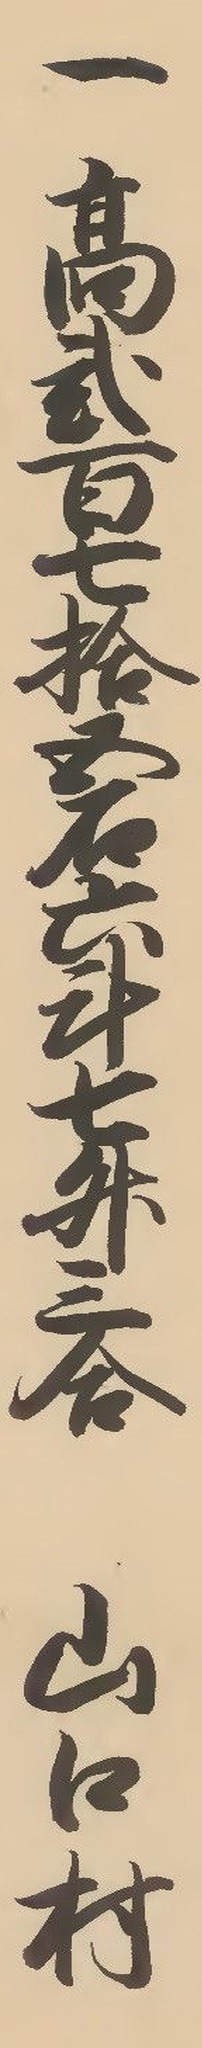一高弐百七拾五石六斗七升三合山口村
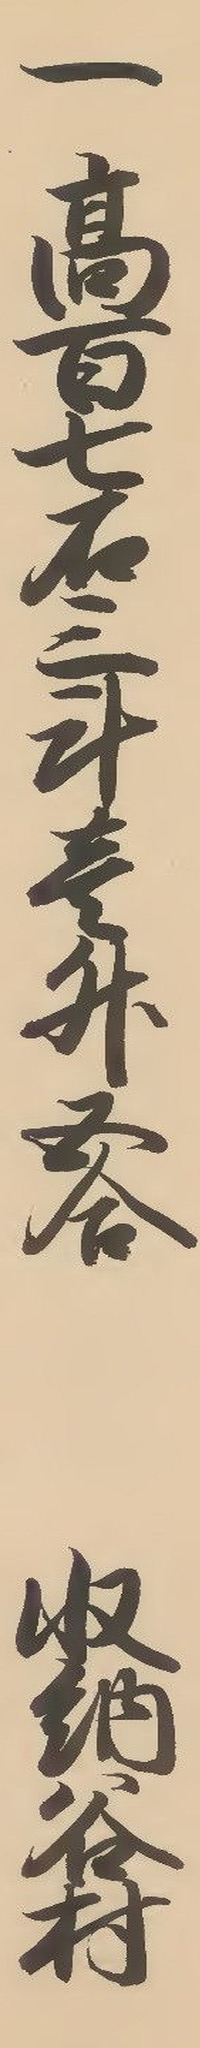一高百七石三斗壱升五合収納谷村
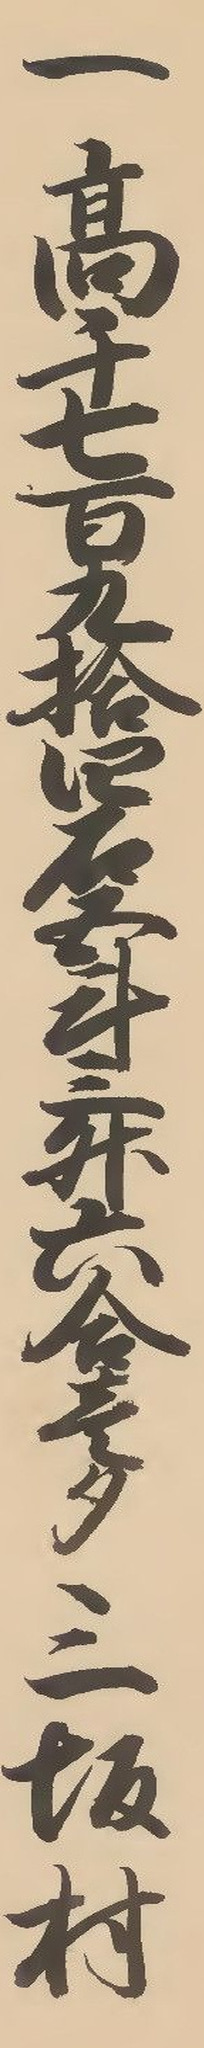一高千七百九拾四石五斗三升六合壱勺三坂村
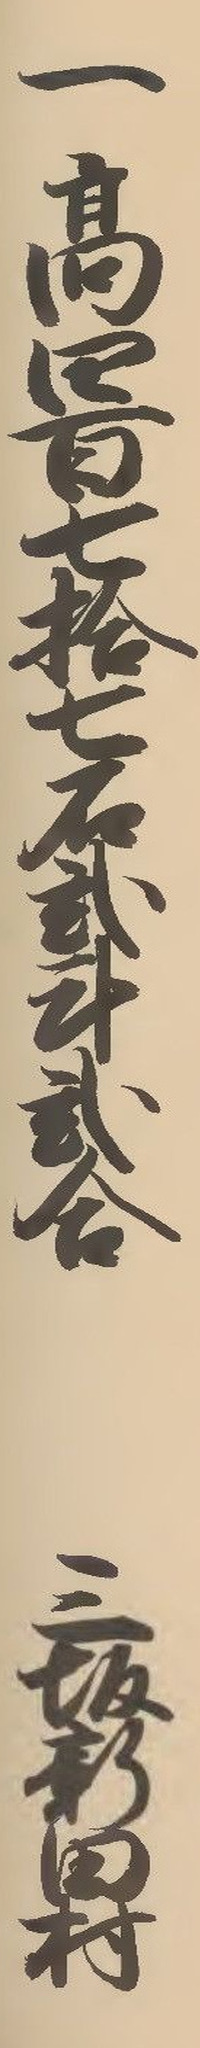一高四百七拾七石弐斗弐合三坂新田村
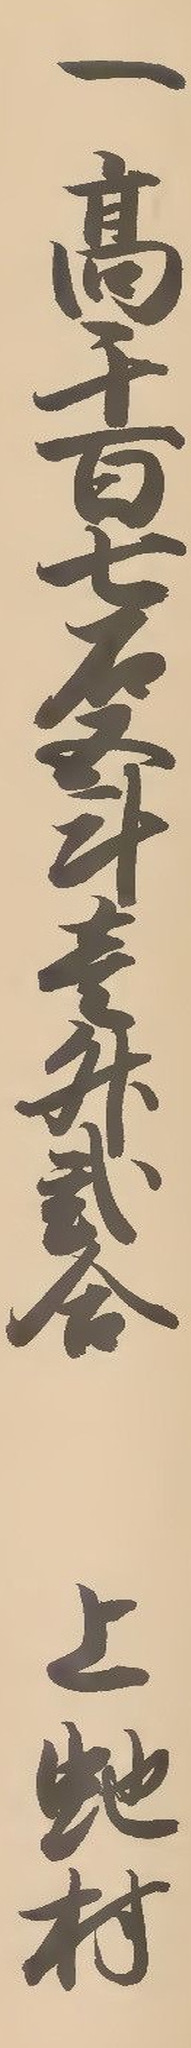一高千百七石五斗壱升弐合上蛇村
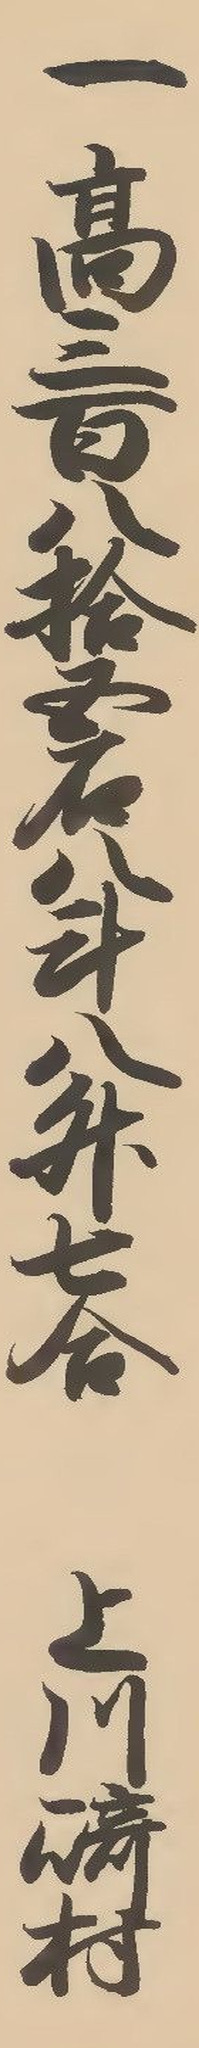一高三百八拾五石八斗八升七合上川崎村
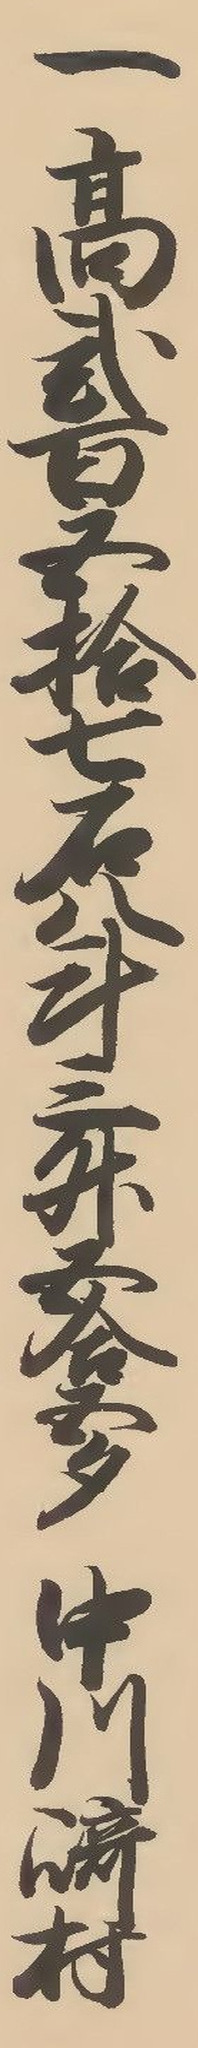一高弐百五拾七石八斗三升五合五勺中川崎村
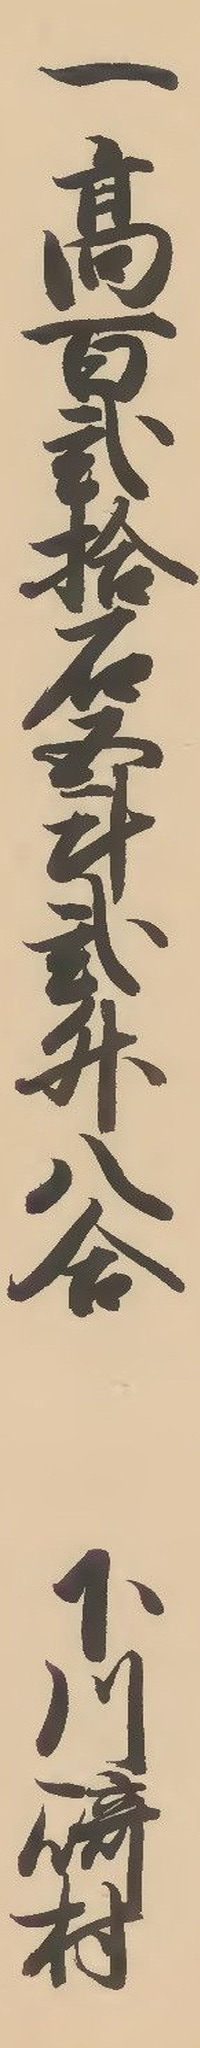一高百弐拾石五斗弐升八合下川崎村

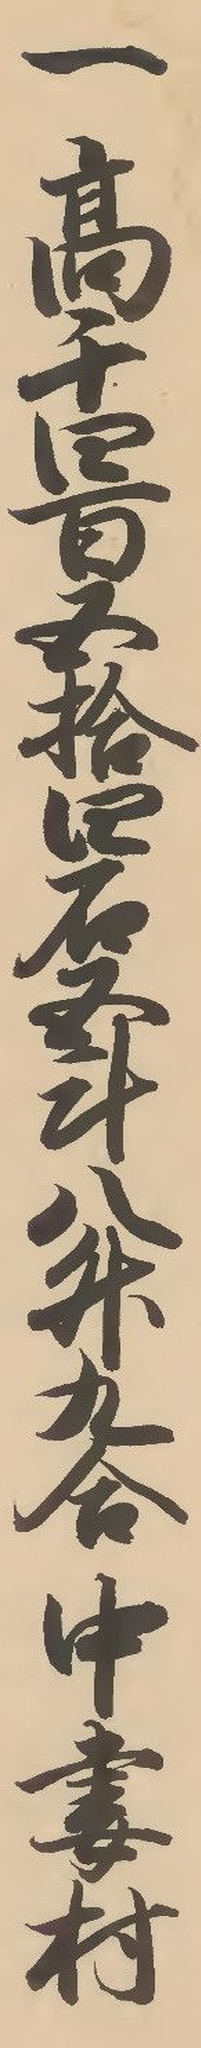一高千四百五拾四石五斗八升九合中妻村
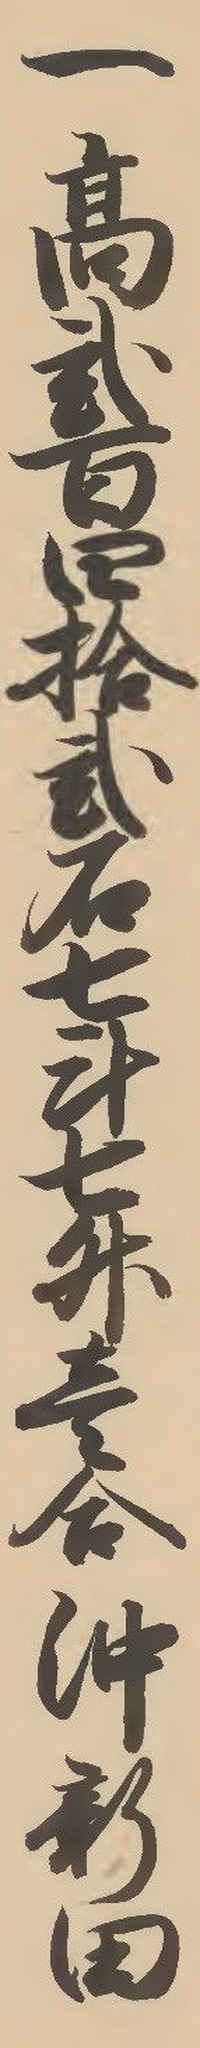一高弐百四拾弐石七斗七升壱合沖新田
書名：下総国郷帳
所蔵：国立公文書館 National Archives of Japan
